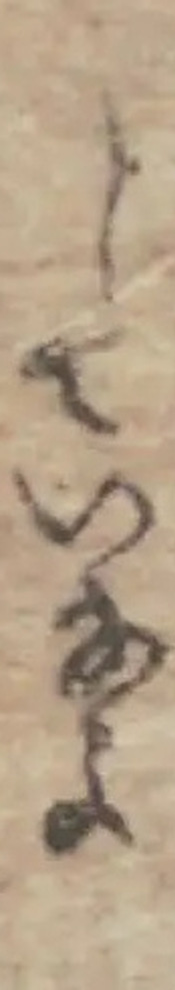していなよ
